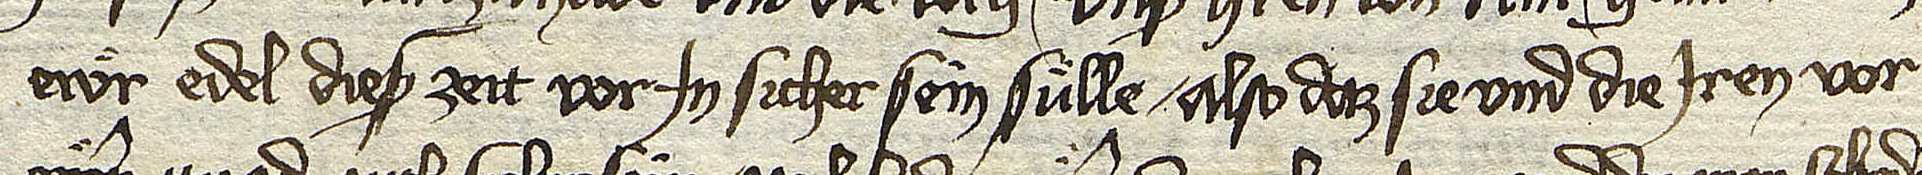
ewr edel dieſ* ʒeit vor In ſicher ſein ſülle / Alſo daʒ ſie vnd die Iren vor
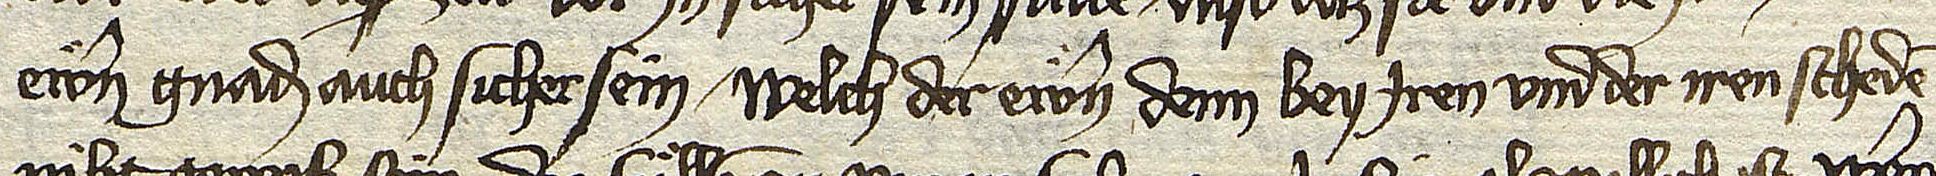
ew*n gnad* auch ſicher ſein / welch der ew*n denn bey Iren vnd der iren ſchede*
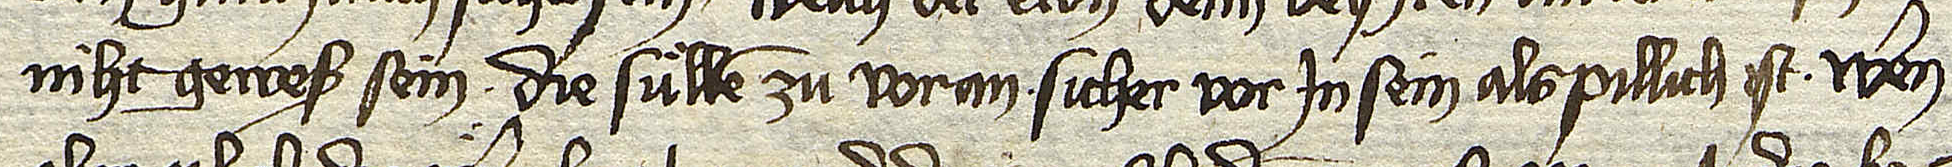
niht geweſ* ſein . die ſülle* ʒu voran . ſicher vor In ſein als pillich iſt . w*en
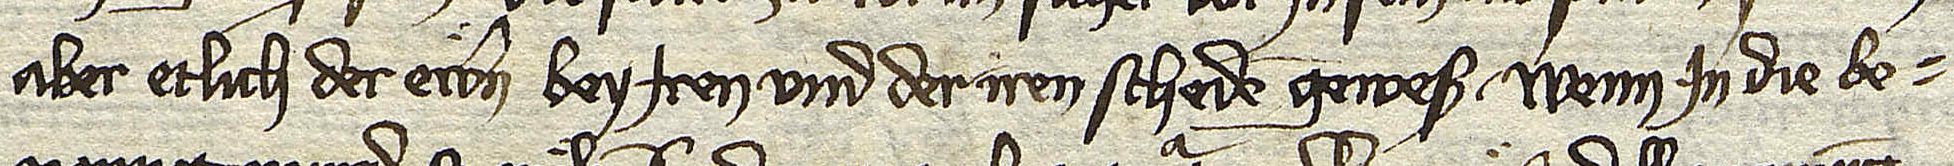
aber etlich der ew*n bey Iren vnd der iren ſchede* geweſ* / wenn In die be =
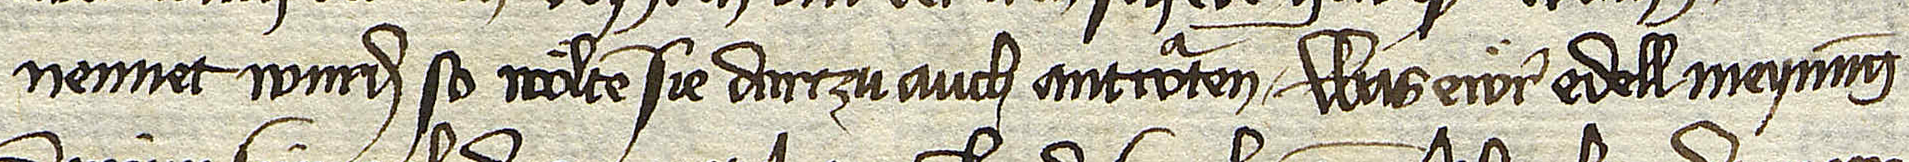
nennet wurd* ſo wölte* ſie darcʒu auch antw*ten / Was ew*r edell meynu*g
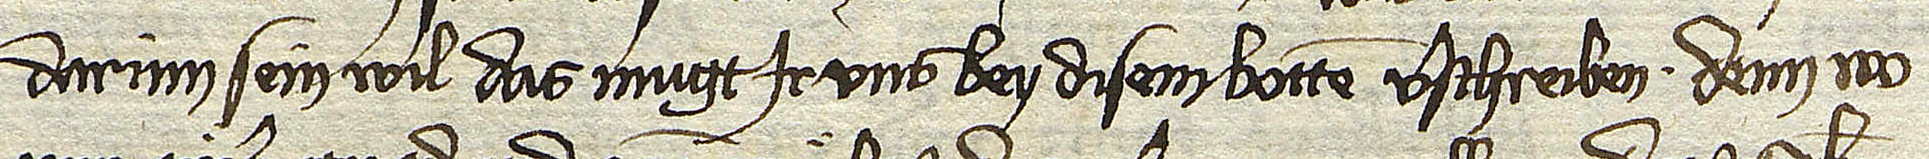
darinn ſein wil das mugt Ir vns bey diſem botte* v*ſchreiben . Denn wo
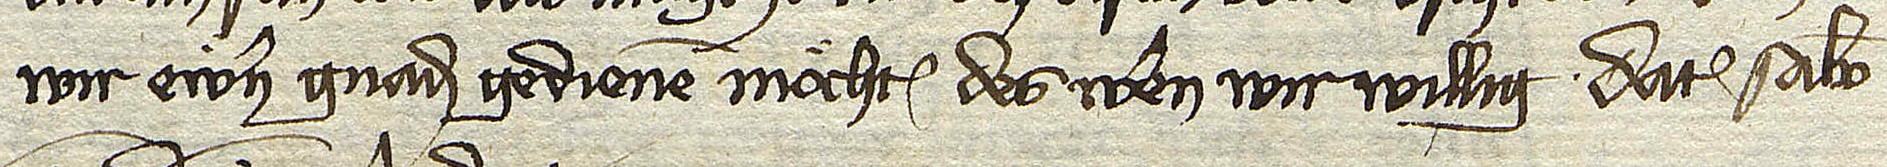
wir ew*n gnad* gediene* möcht* des we*n wir willig . Dat* ſabo*
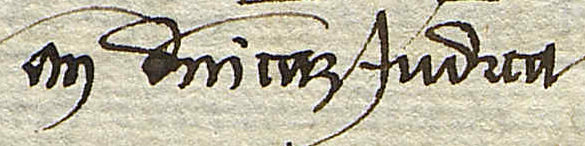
an* dnica* Iudica
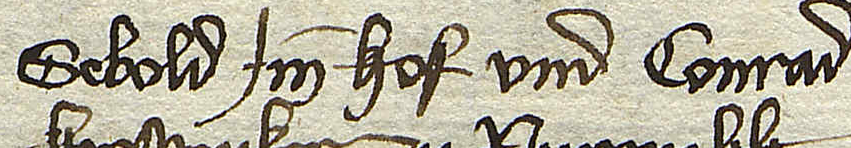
Sebold Im* hof vnd Conrad
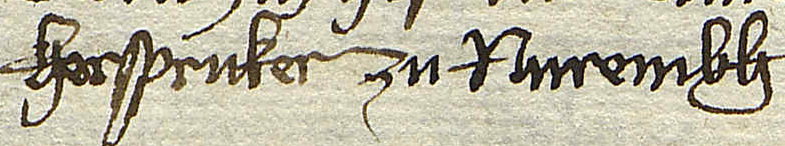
hersſpruker ʒu Nuremb*g
